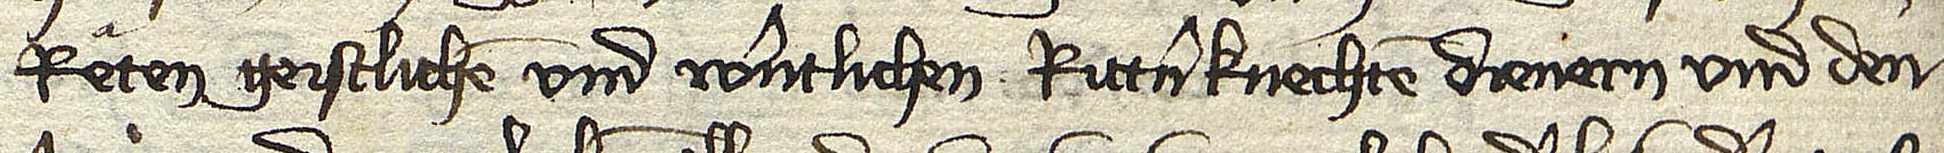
Rëten geiſtliche* vnd w*ntlichen . Ritt*n knechte* dienern vnd den
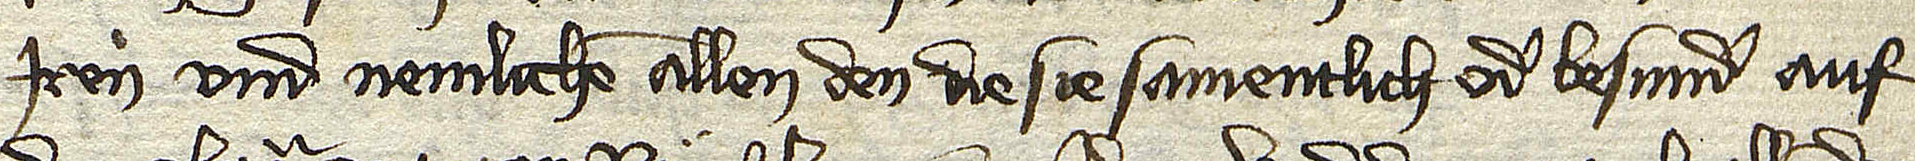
Iren vnd nemliche* allen den die ſie ſamentlich od* beſund* auf
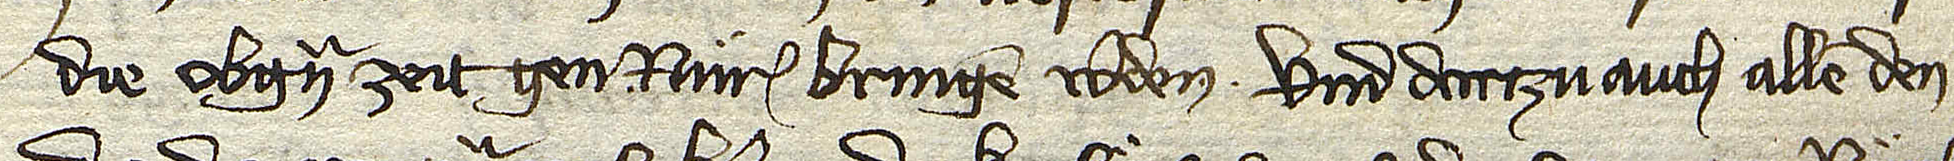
die obgn* ʒeit gen Nür* bringe* w*den . Vnd darcʒu auch alle* den
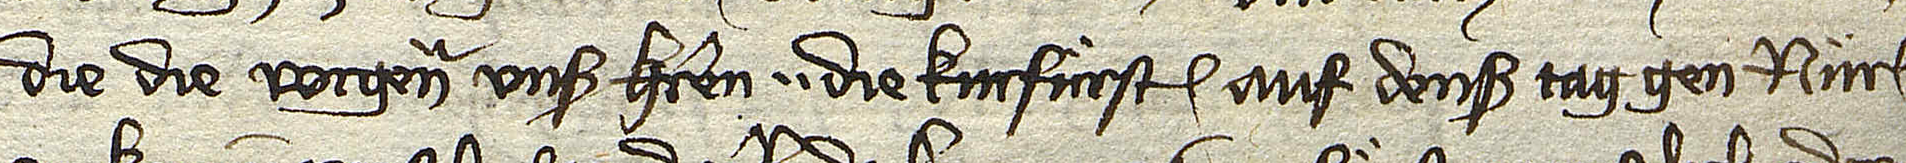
die die vorgen* vnſ* h*ren ~ die kurfürſt* auf demſ* tag gen Nür*
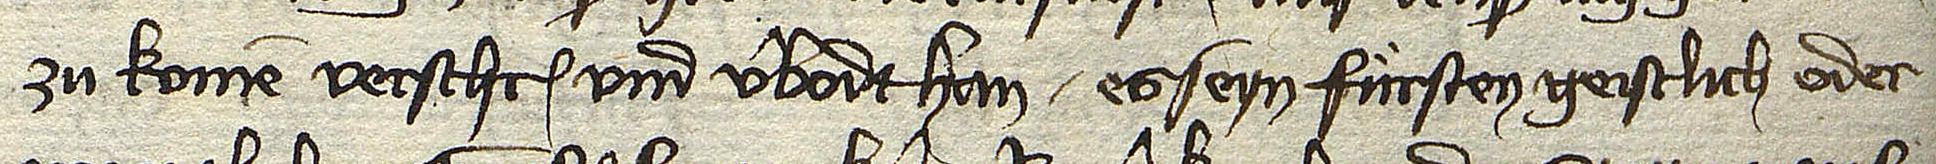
ʒu kome* verſchr* vnd v*bodt han / es ſeyn fürſten geiſtlich oder
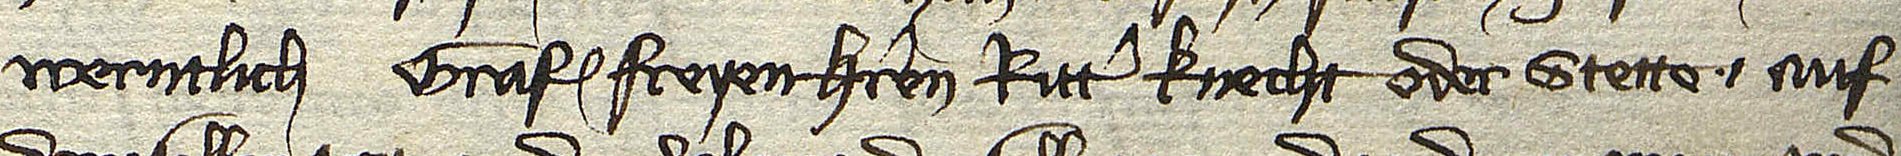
werntlich Graf* freyen h*ren Ritt* knecht oder Stette . / auf
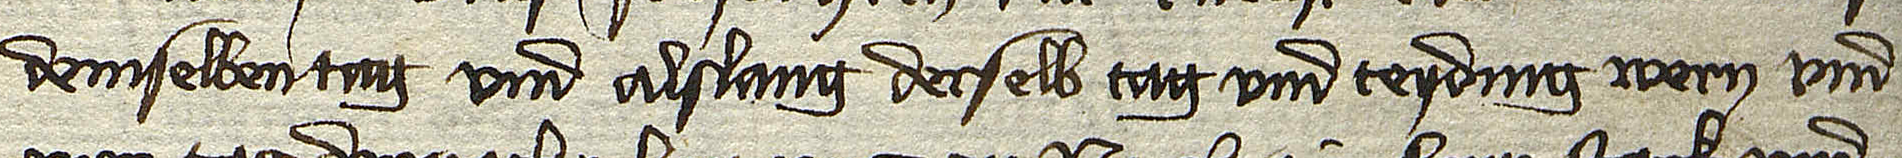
demſelben tag vnd alſlang derſelb tag vnd teyding wern vnd
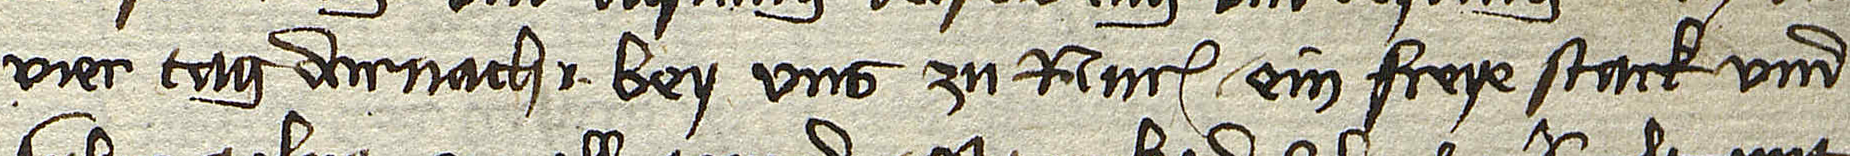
vier tag darnach . bey vns ʒu Nur* / ein freye ſtark vnd
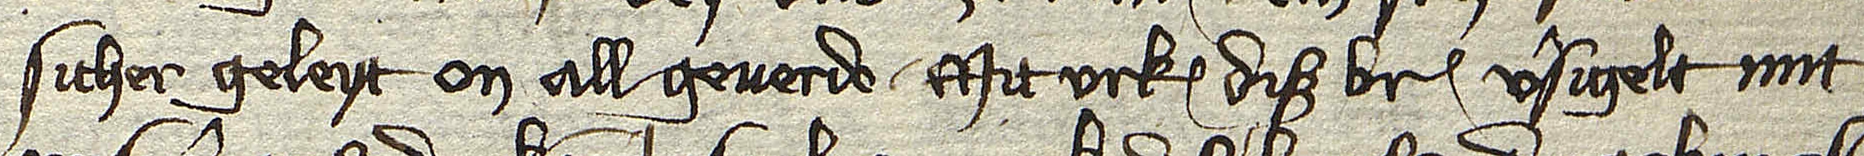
ſicher geleyt on all geuerde / Mit vrk* diſʒ br* v*ſigelt mit
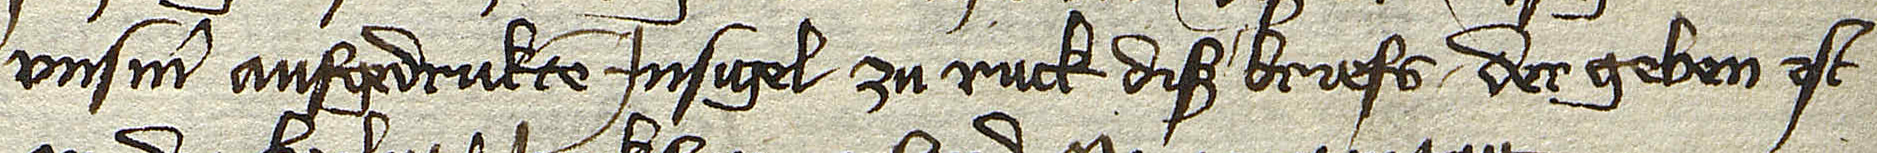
vnſ*m aufgedrukte* Inſigel ʒu ruck diſʒ briefs / der geben iſt
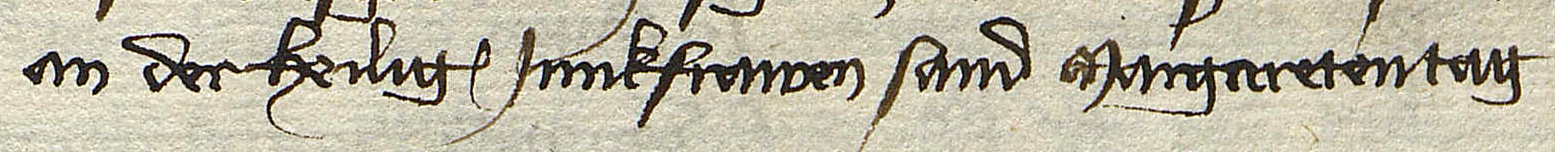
an der heilig* Iunkfrawen ſand Margareten tag
